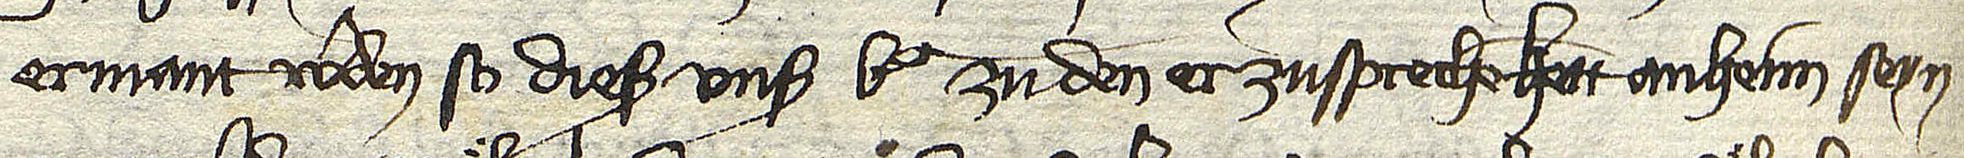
ermant w*den ſo dieſ* vnſ* b* ʒu den er ʒuſpreche* hett anheim ſeyn
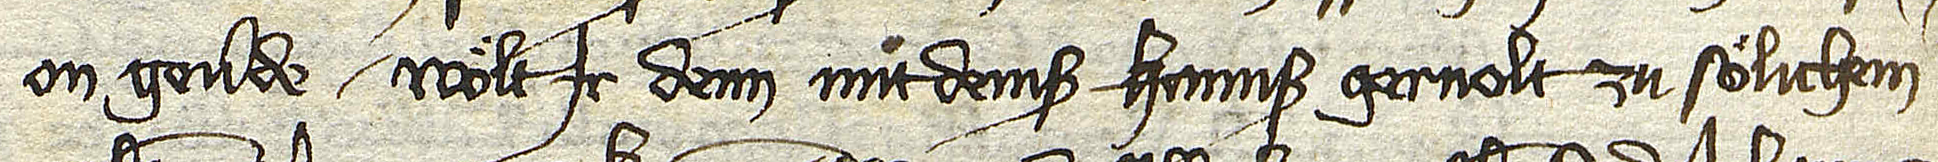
on geu*de / wölt Ir denn mit demſ* hannſ* gernolt ʒu ſölichem
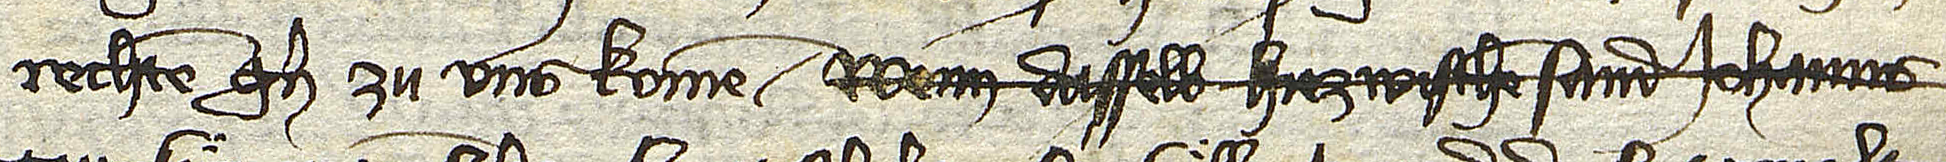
rechte* g*n ʒu vns kome* / wenn daſſelb hieʒwiſche* ſand Iohanns
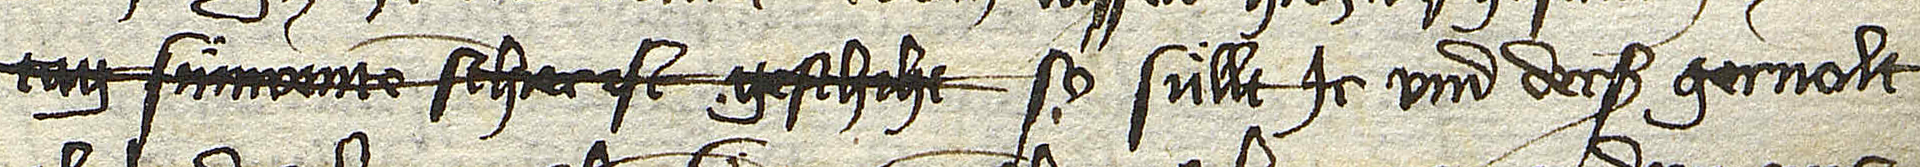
tag ſünwente* ſchieriſt geſchiht ſo ſüllt Ir vnd derſ* gernolt
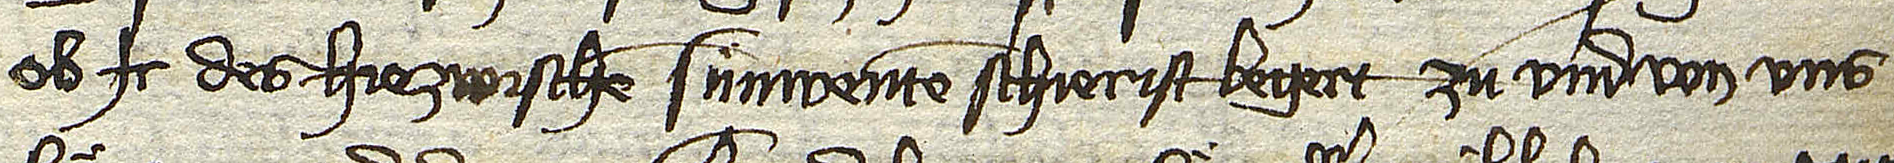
ob Ir des hieʒwiſche* ſünwente* ſchieriſt begert ʒu vnd von vns
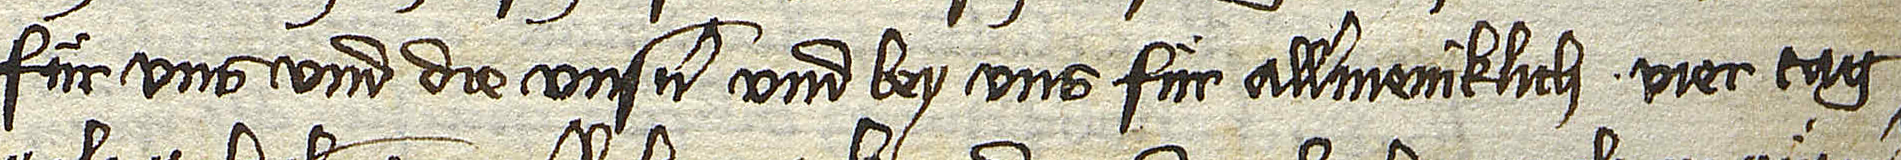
für vns vnd die vnſ*n vnd bey vns für all*meniklich . vier tag
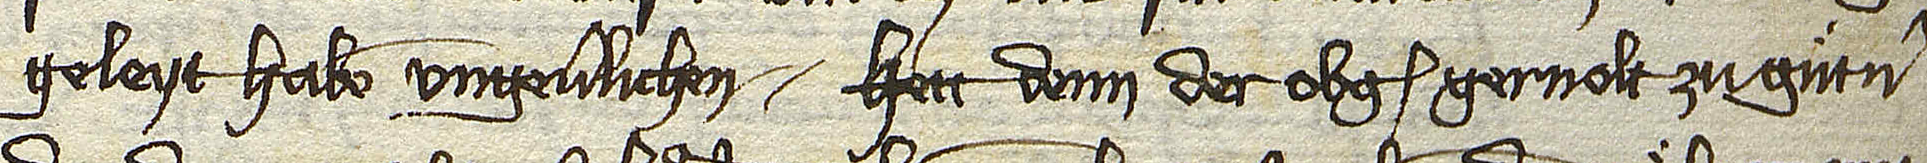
geleyt habe* vngeu*lichen / Hett denn der obg* gernolt ʒu gütn*
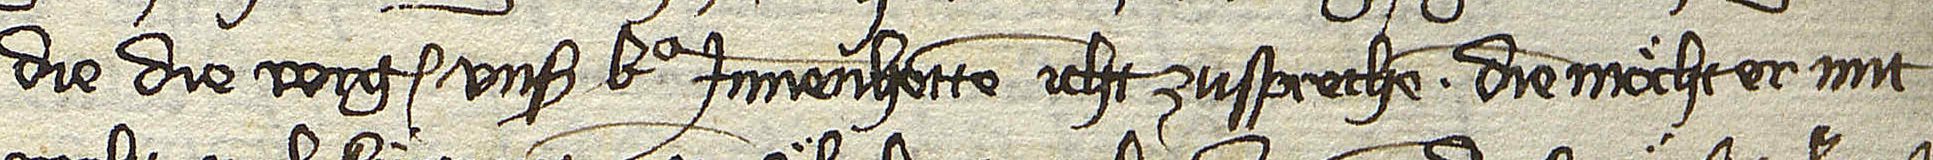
die die vorg* vnſ* b* Innenhette* icht ʒuſpreche* . die möcht er mit
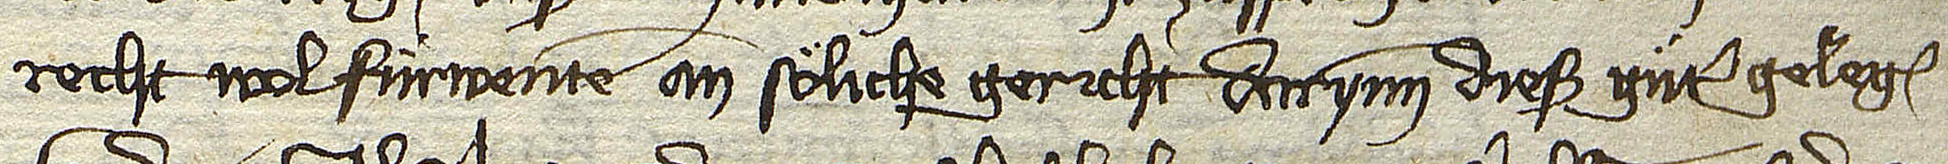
recht wol fürwente* an ſöliche gericht darynn* dieſ* güt* geleg*
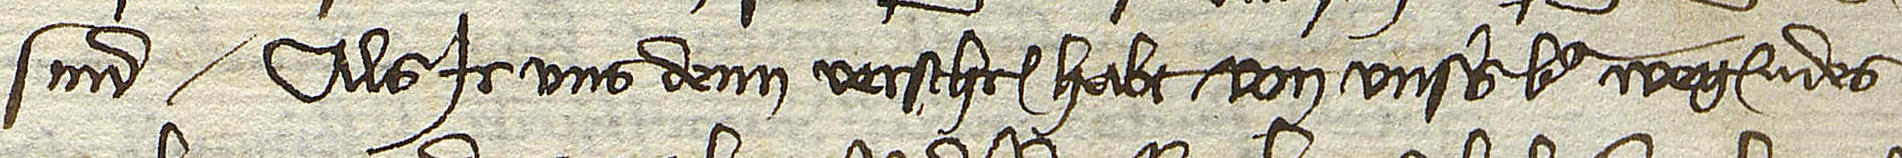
ſind / Als Ir vns denn verſchr* habt / von vnſ*s b* weg* ~ des
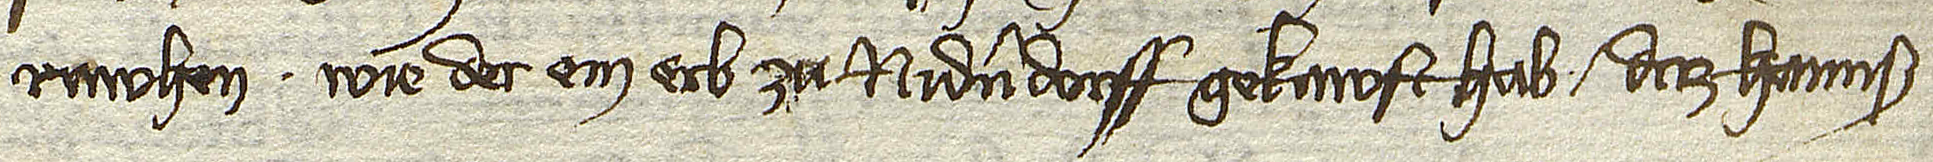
rawhen . wie der ein erb ʒu Nid*ndorff gekawft hab / daʒ hannſ*
